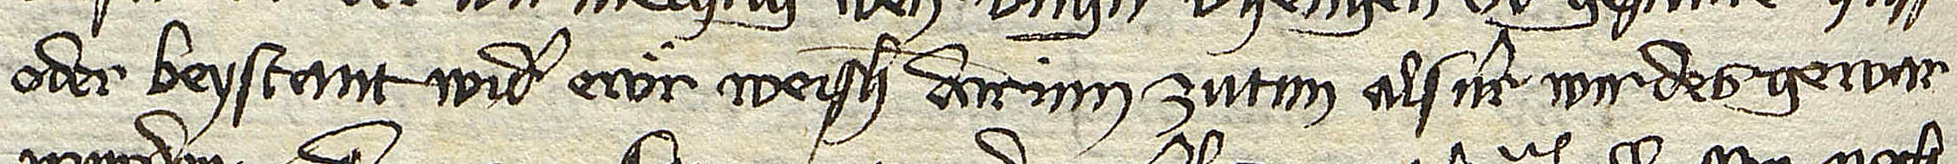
oder beyſtant wid* eẅr weiſh* darinn ʒutun alſur* wir des gewar
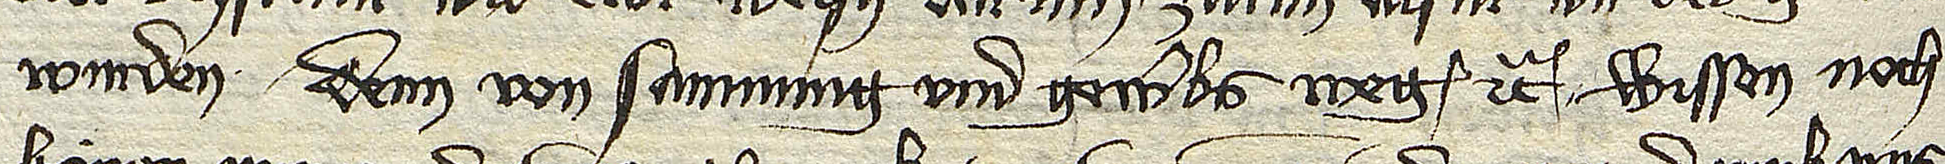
wurden . Denn von ſamnung vnd gew*bs weg* ec* Wiſſen noch
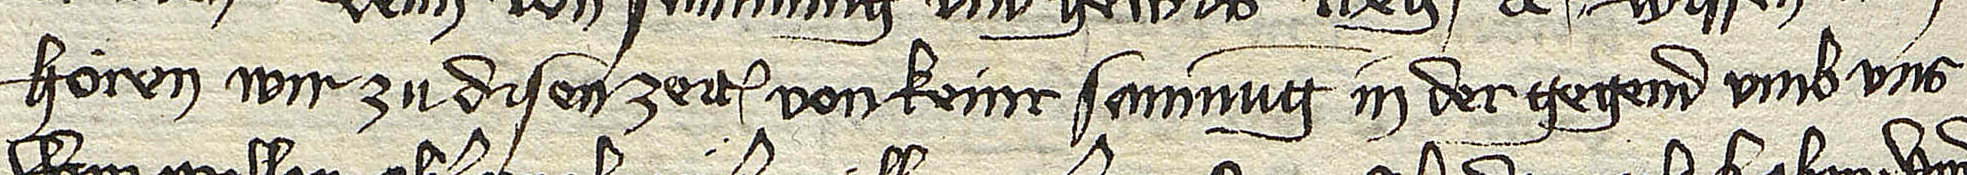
hören wir ʒu diſen ʒeit* von keine ſam*nug in der gegend vmb vns
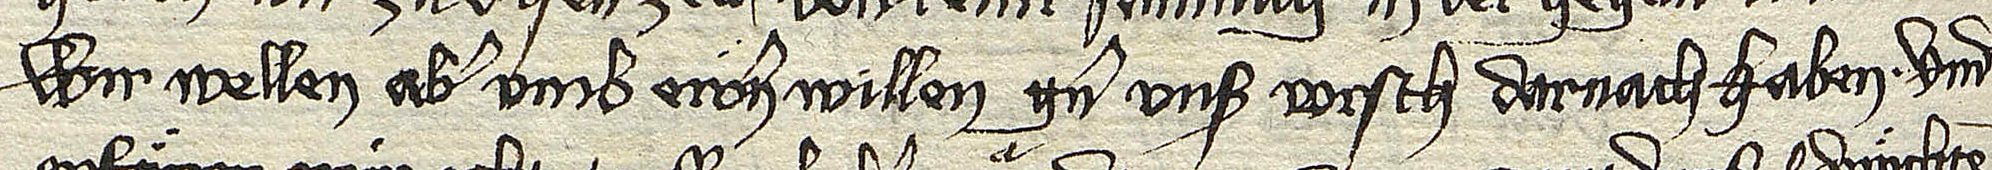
Wir wellen ab* vmb eẅch willen gn* vnſ* vorſch darnach haben . Vnd
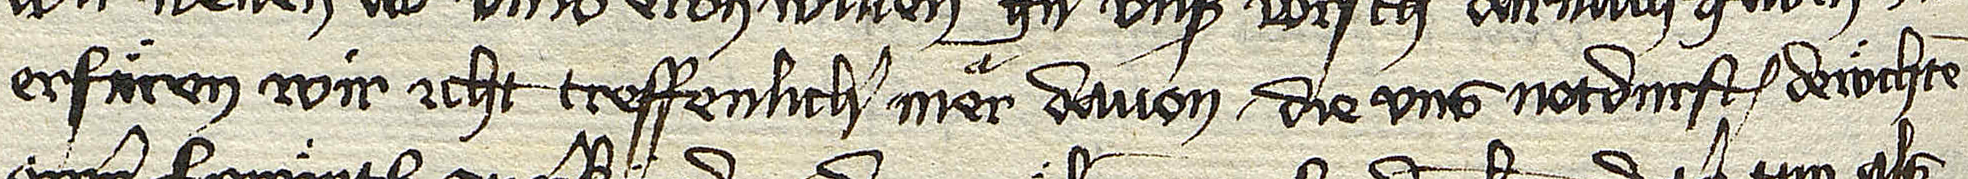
erfüren wir icht* treffenlich* mër dauon / die vns notdurft* dewchte*
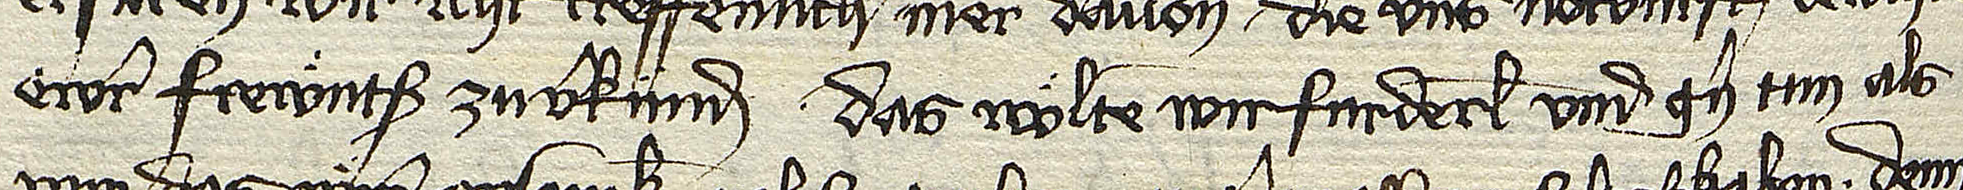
ewr* freẅntſ* ʒu v*künd* . Das wölte* wir furderl* vnd g*n tun als
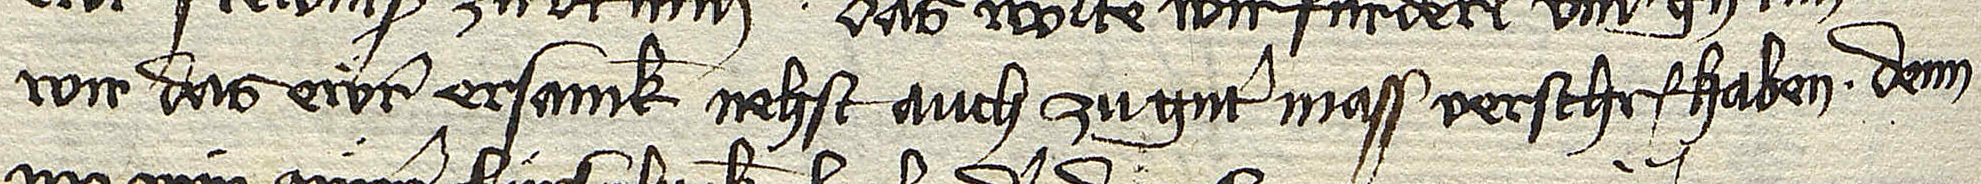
wir das eẅr* erſamk* nehſt auch ʒu gut* maſſ verſchr* haben . Denn
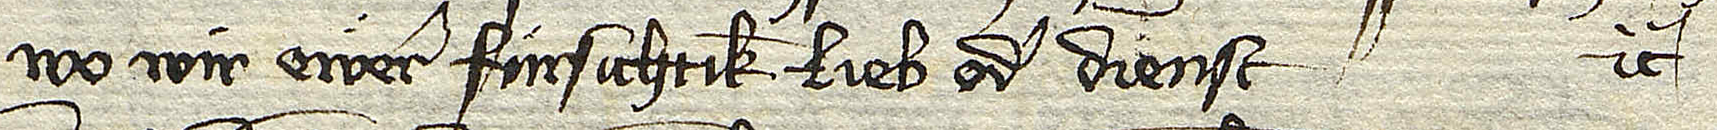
wo wir eẅer* fürſichtik* lieb od* dienſt ec*
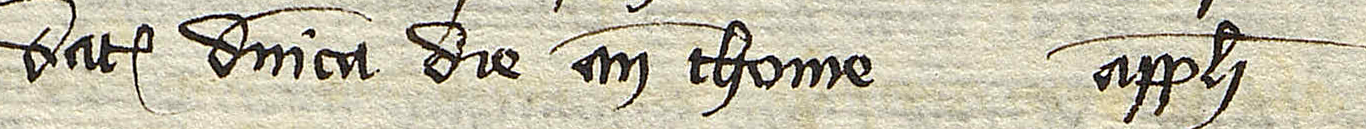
Dat* d*nica die an* thome app*li
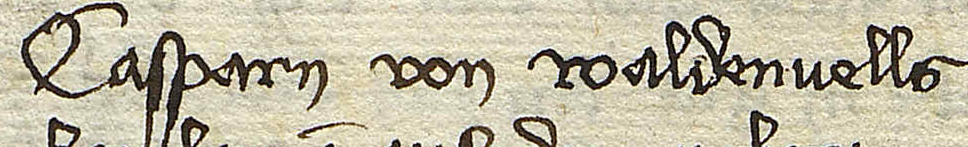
Caſparn von waldenuells
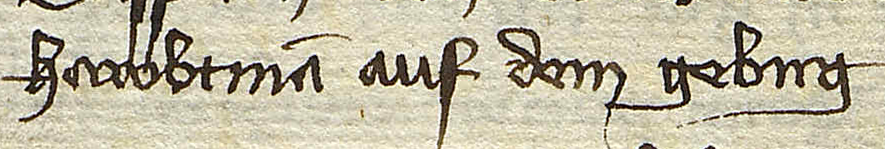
hawbtma* auf dem gebirg
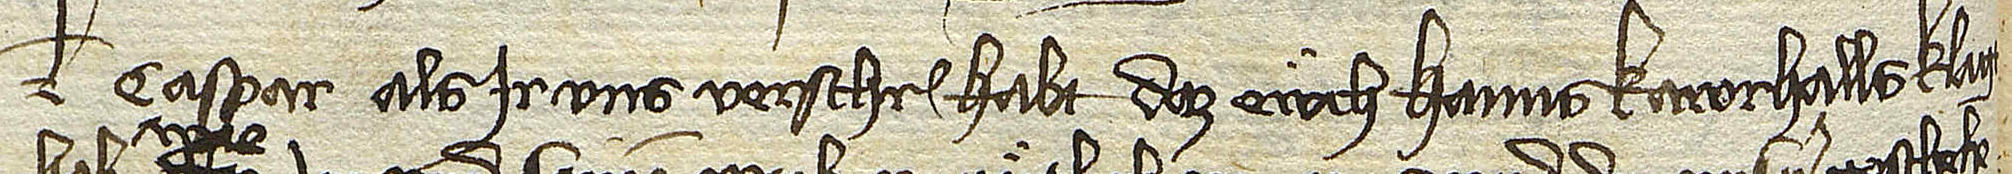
L* Caſpar als Ir vns verſchr* habt daʒ eẅch Hanns Kawrhalls klagt
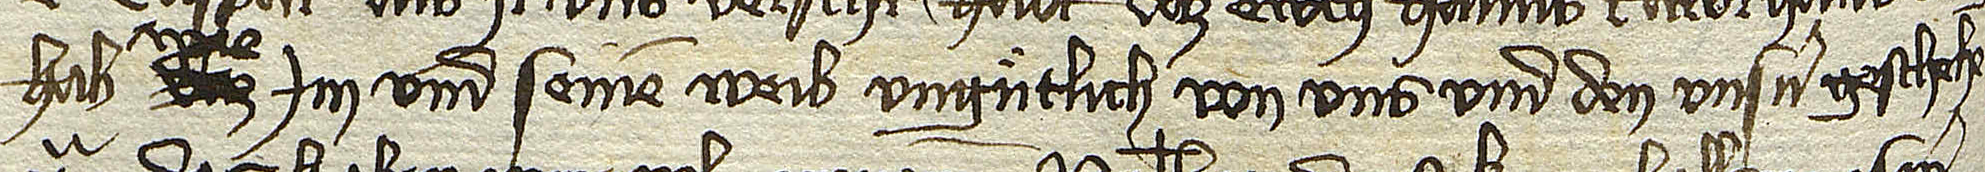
hab daʒ Im vnd ſeine* weib vngütlich von vns vnd den vnſ*n geſchehe
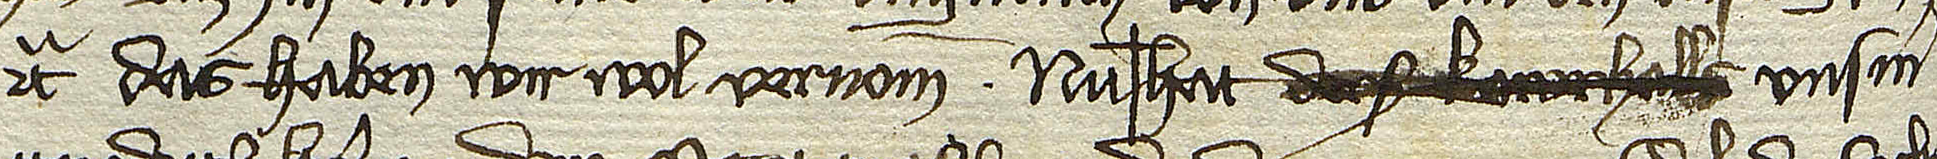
ec* das haben wir wol vernom* . Nu hat derſ* kawrhalls vnſ*m
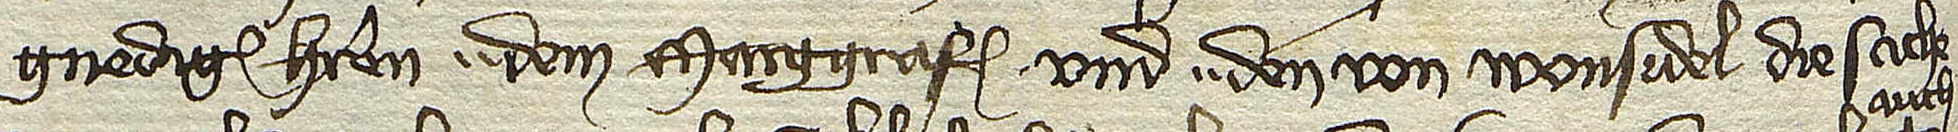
gnedig* h*ren dem Marggraf* . vnd ~ den von wonſidel die ſache
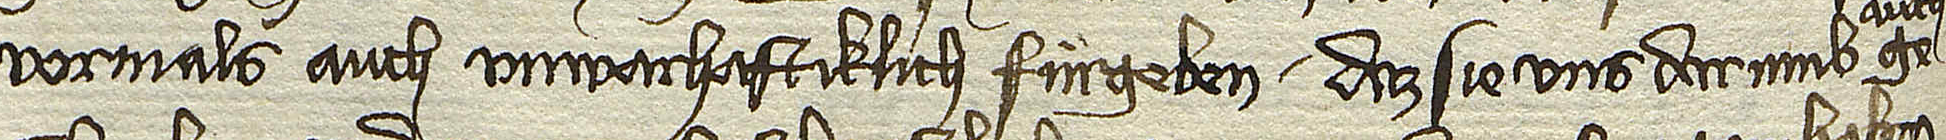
vormals auch vnwarhaftiklich fürgeben / daʒ ſie vns darumb ge =
